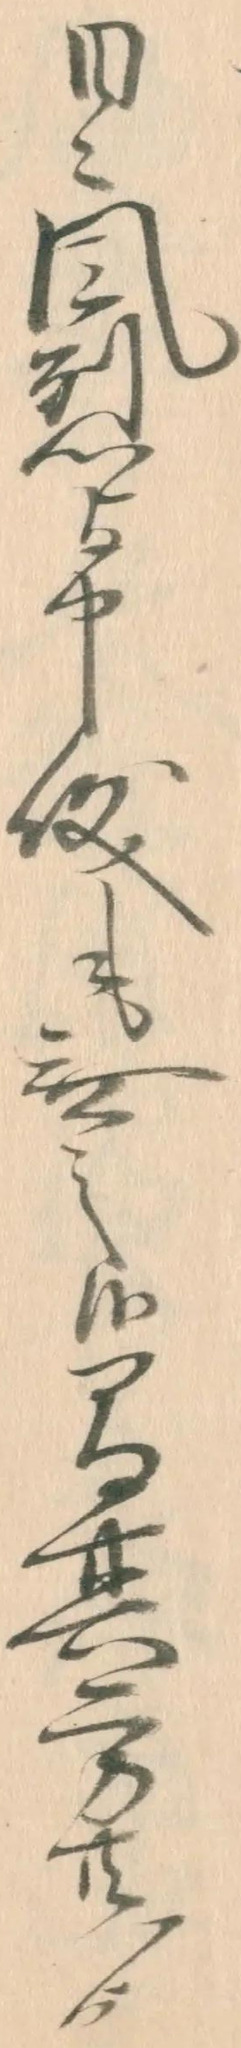日々風烈と申儀も無之候間其方共ゟ
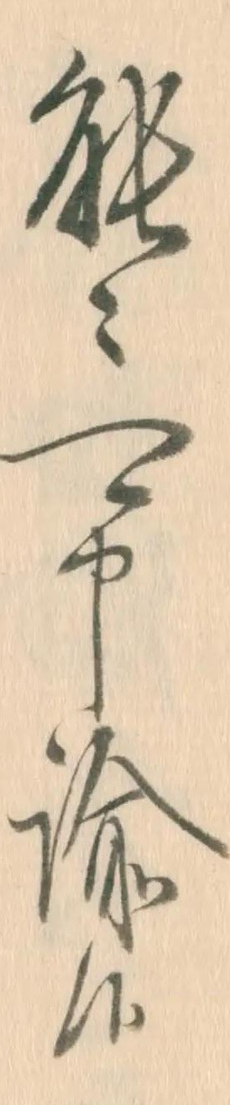能々可申諭候
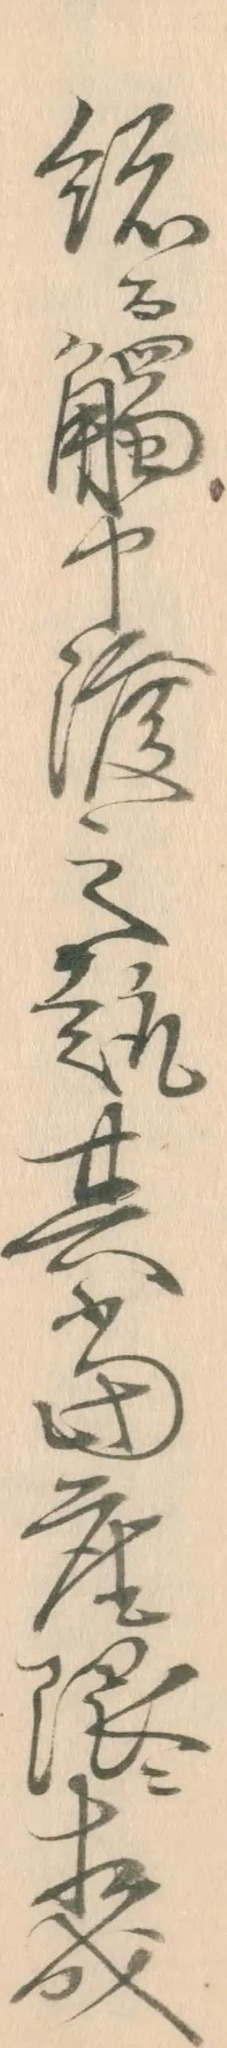一総而触申渡之趣其当座限ニ相成
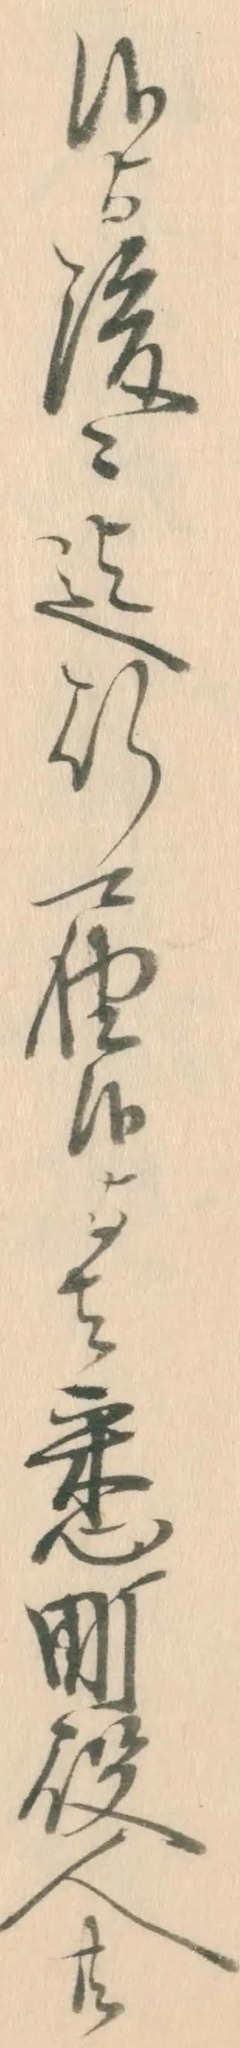候と後々迄行届候とは悉町役人共
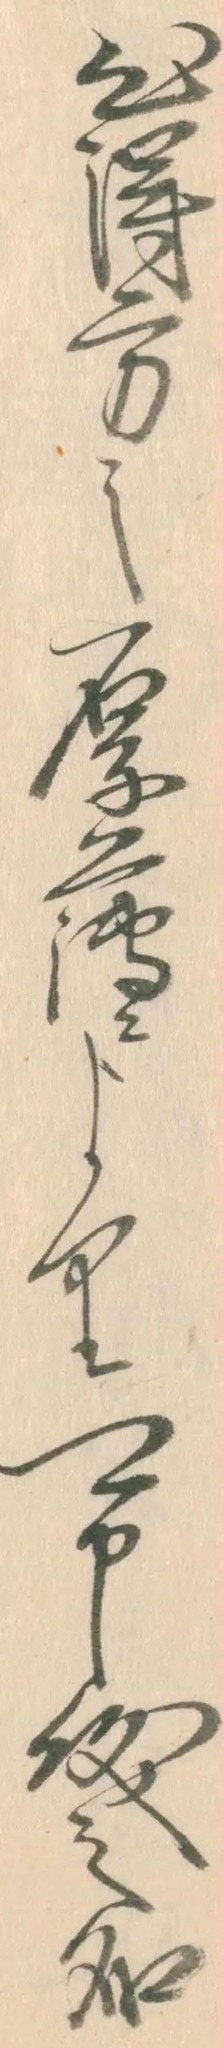心得方之厚薄ニより可申儀之処
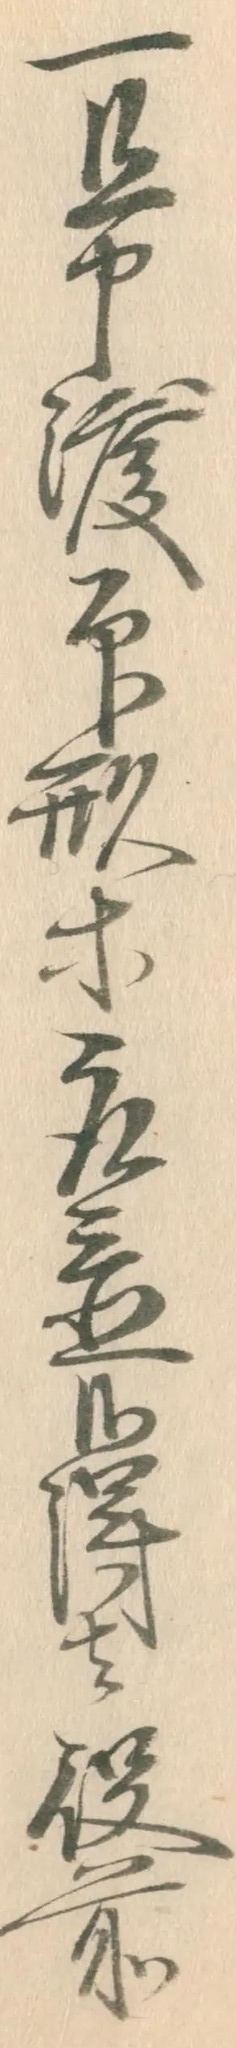一旦申渡印形等取置候得は役前
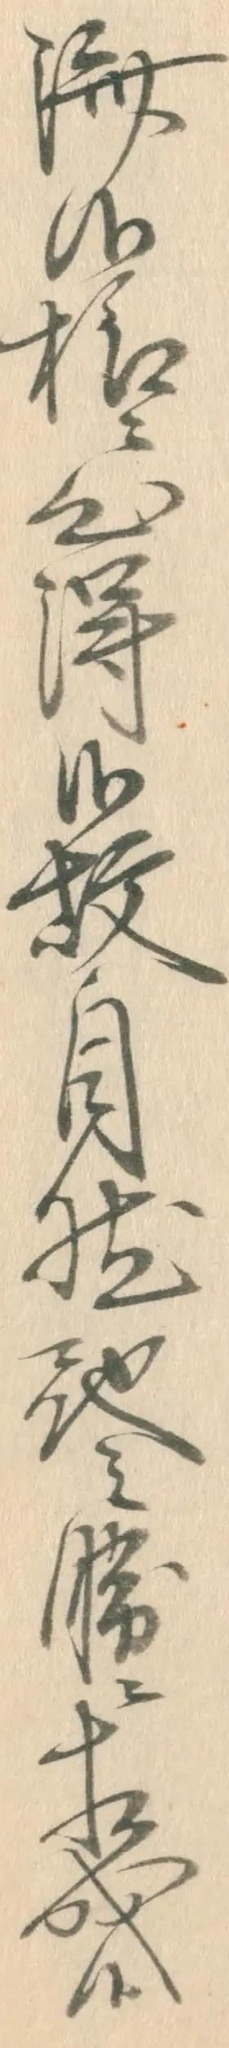済候様ニ心得候故自然弛ミ勝ニ相成候

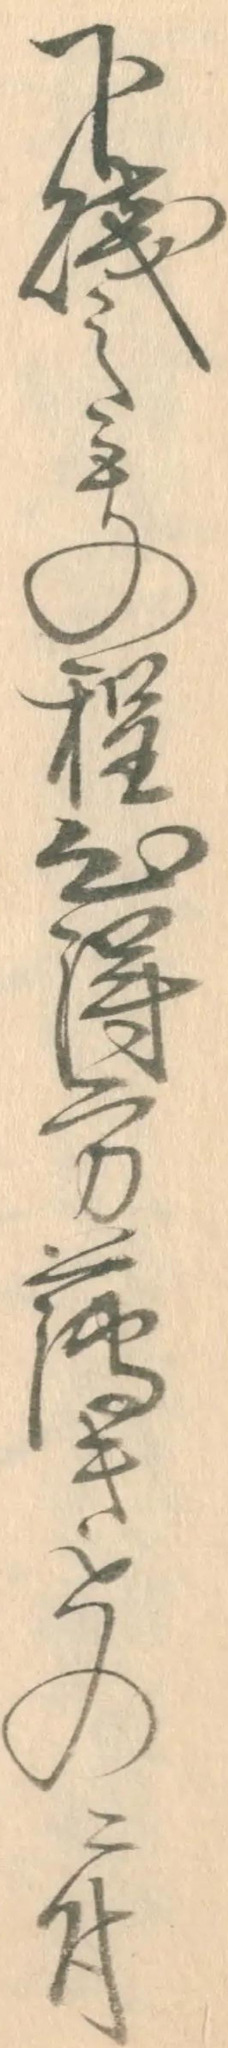下賎之もの程心得方薄キものニ付
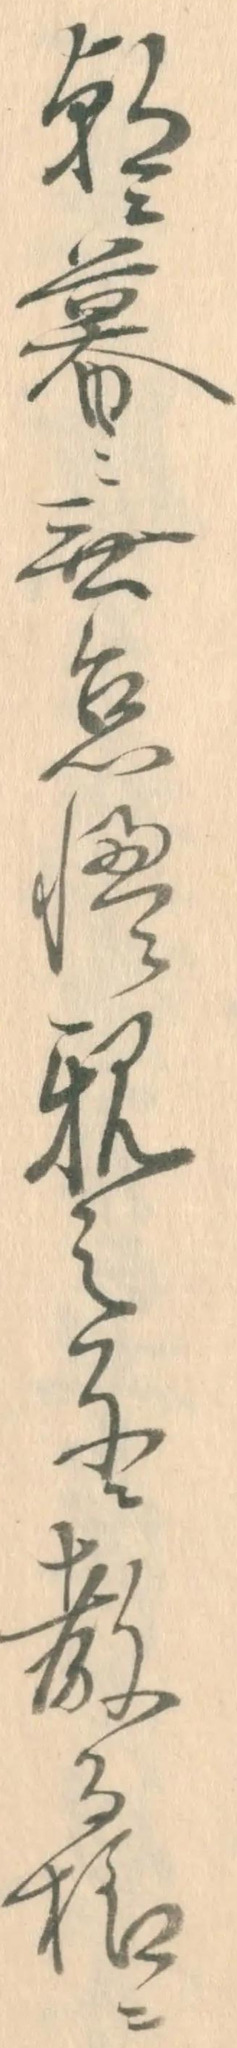朝暮ニ無怠慢親之子ニ教る様ニ
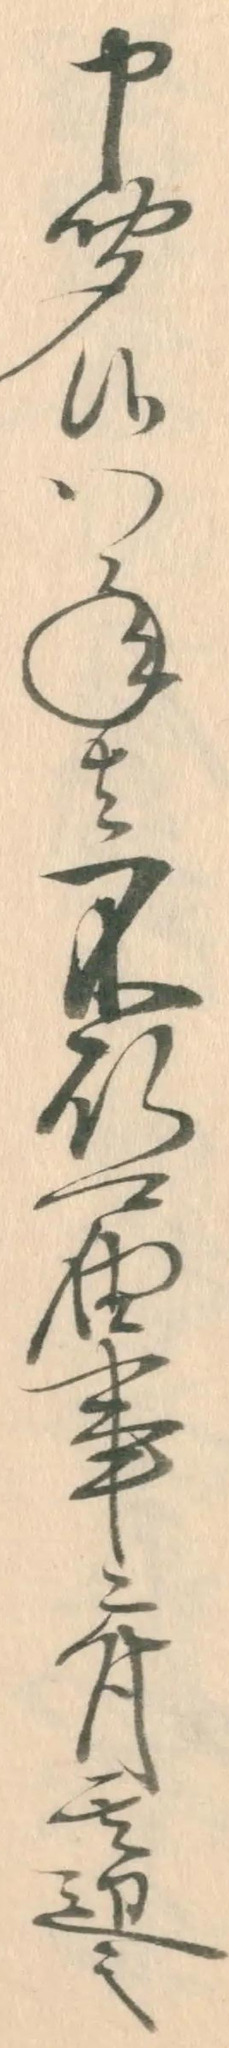申聞候はねは不行届事ニ付其辺之
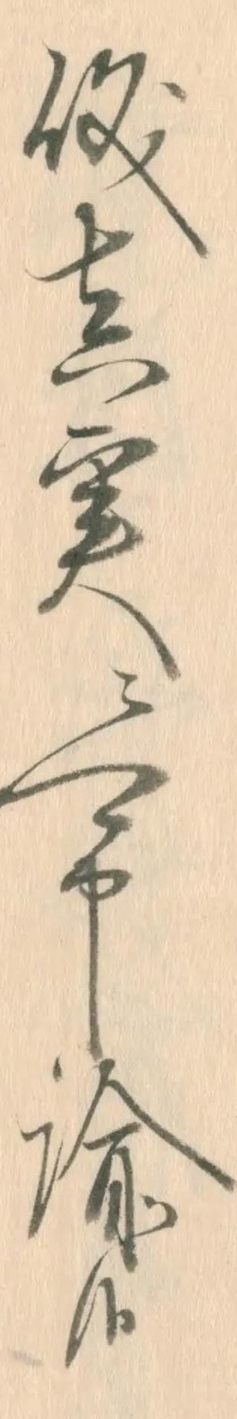儀真実ニ可申諭候
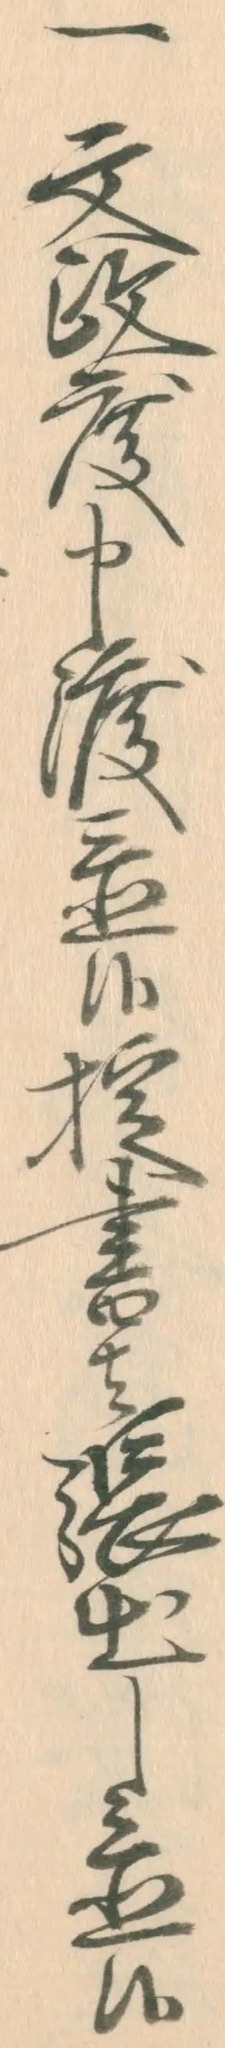一文政度申渡置候掟書は張出し置候
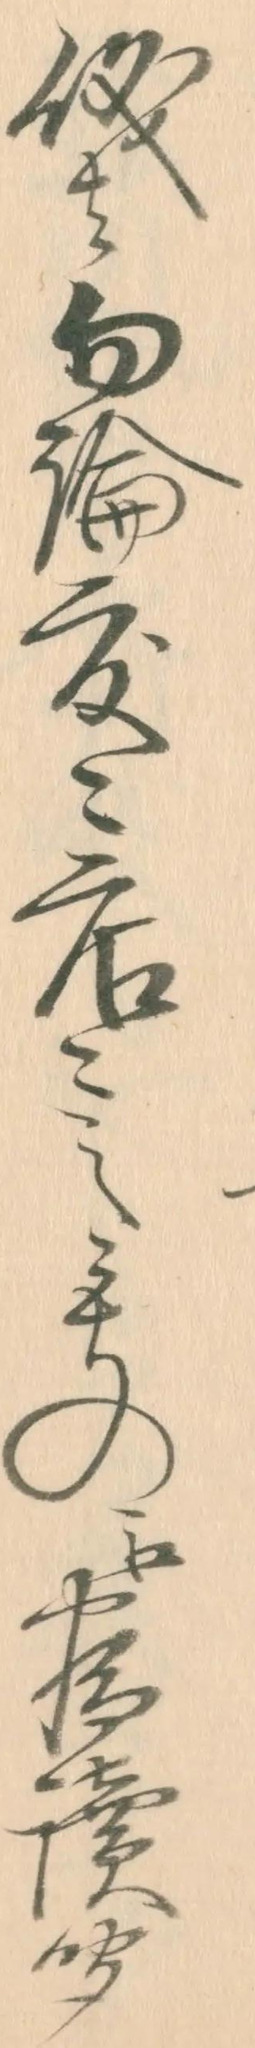儀は勿論度々店々之ものえ為読聞
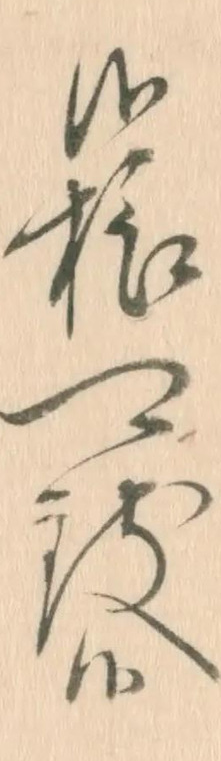候様可致候
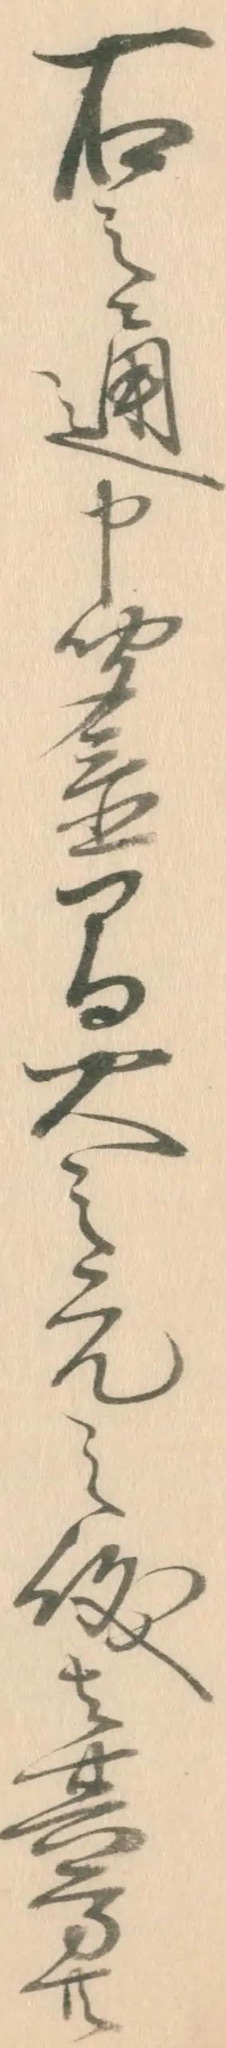右之通申聞置間火之元之儀は其方共
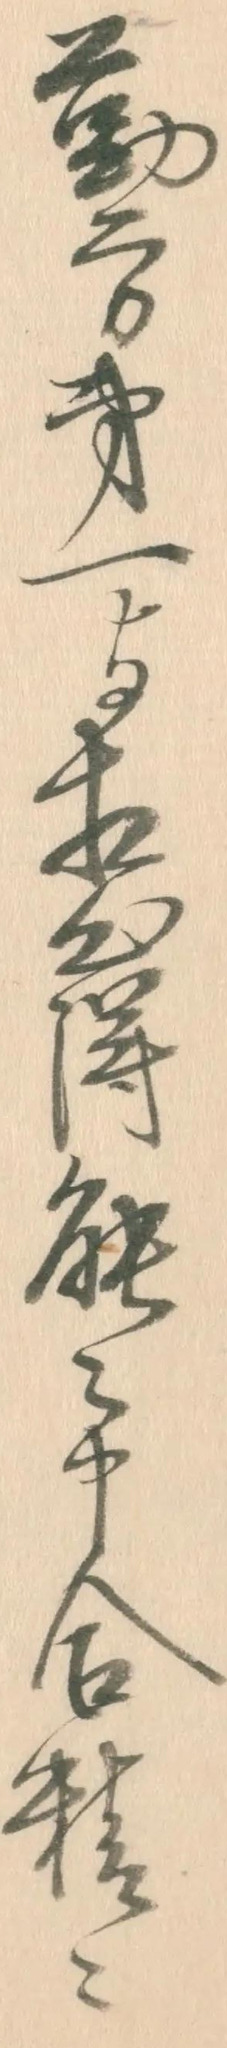勤労第一と相心得能々申合精々
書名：三橋 17巻. [7] 三橋小破御修復書留　但御奉行御掛リ替地震潰橋番屋　嘉永四亥年より安政二卯年迄　上
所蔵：国立国会図書館 National Diet Library, JAPAN
